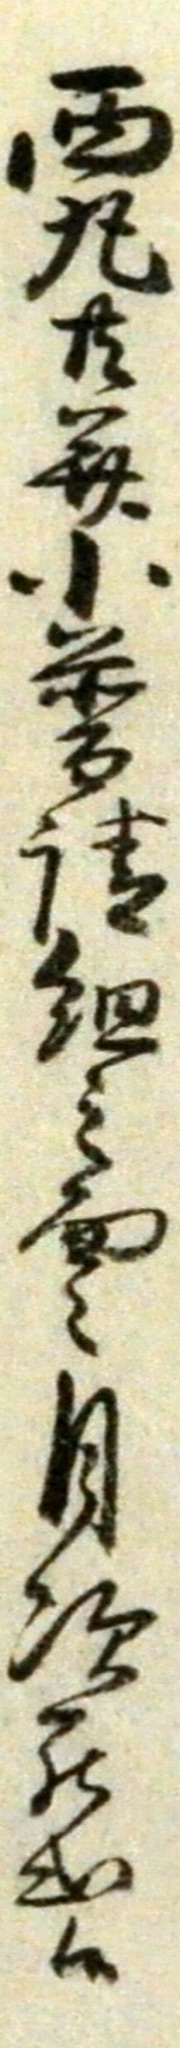西丸共并小普請組之面々月次罷出候
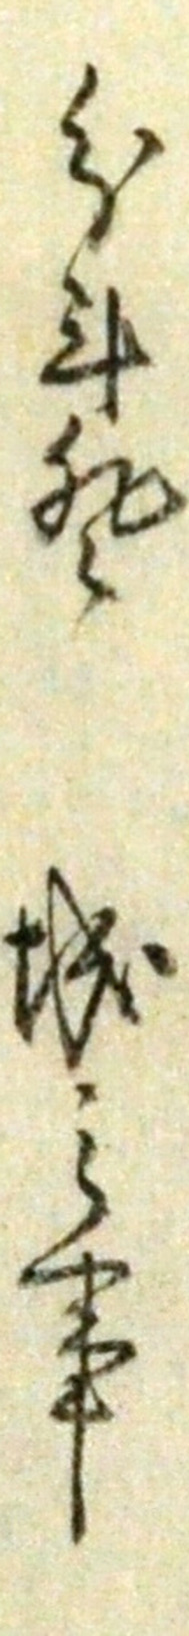分計登城之事
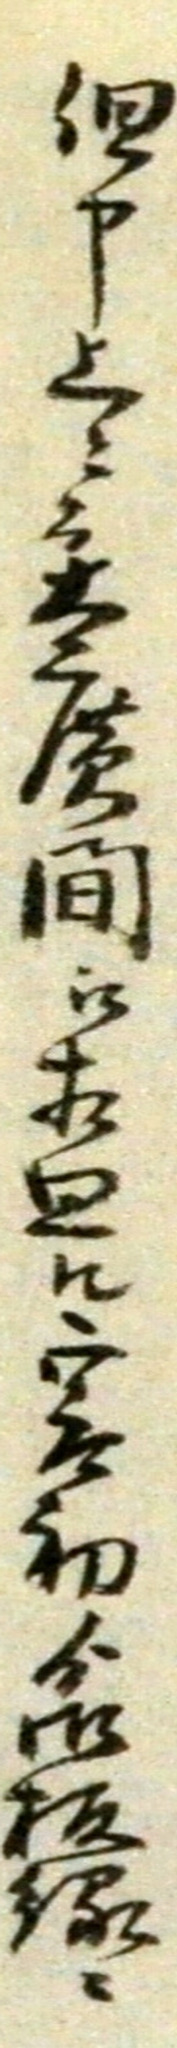但申上ニ而大廣間え相廻ル最初ゟ御板縁ニ
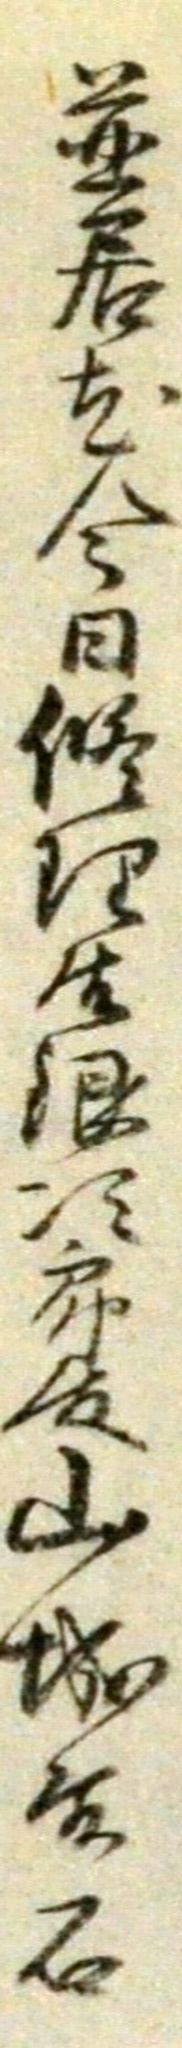並居尤今日修理殿銀次郎殿山城殿石
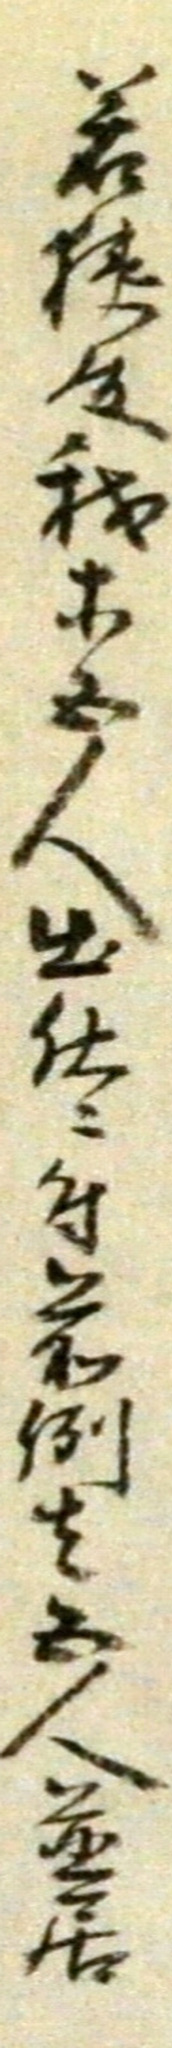若狭殿我等五人出仕ニ付前例は五人並居
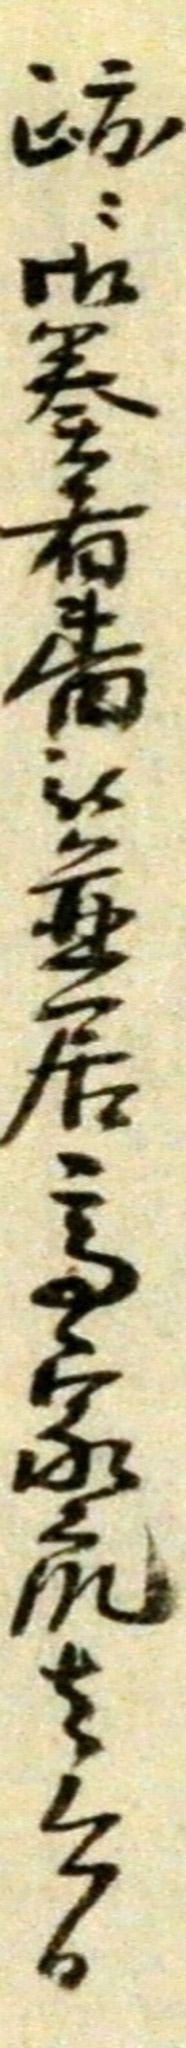跡ニ御奏者番被並居高家衆は今日
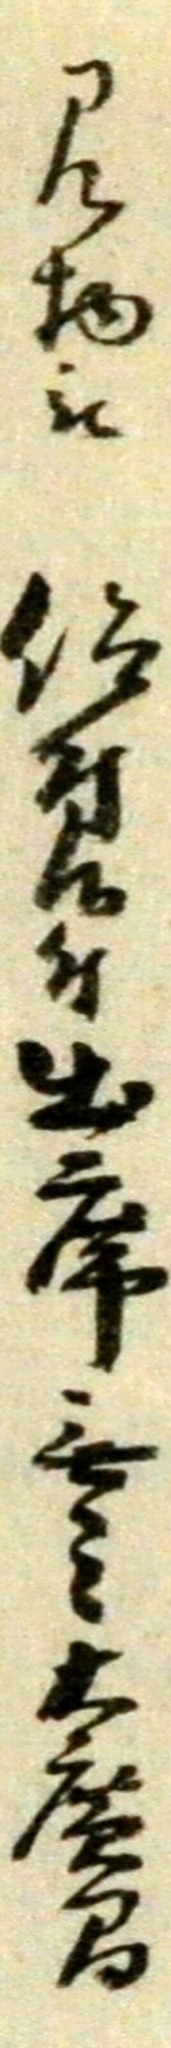見物被仰付候付出席無之大廣間
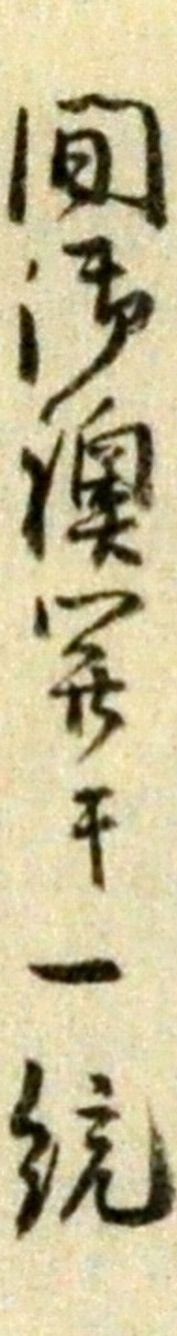間御襖開キ一統
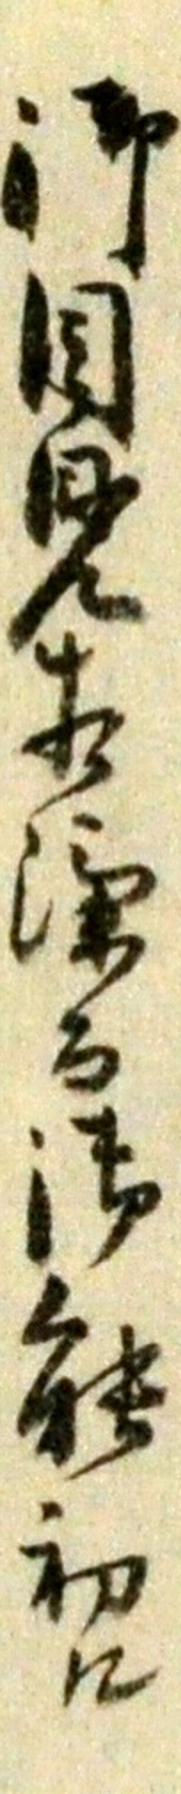御目見相済而御能初ル
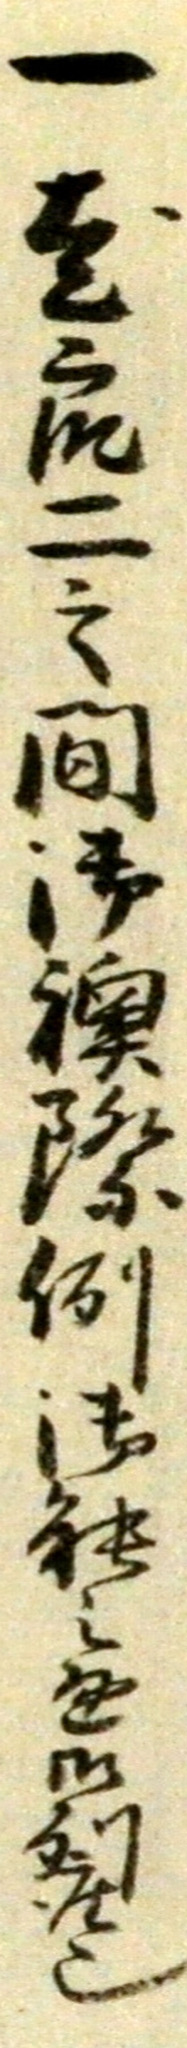一老衆二之間御襖際例御能之通御列座也
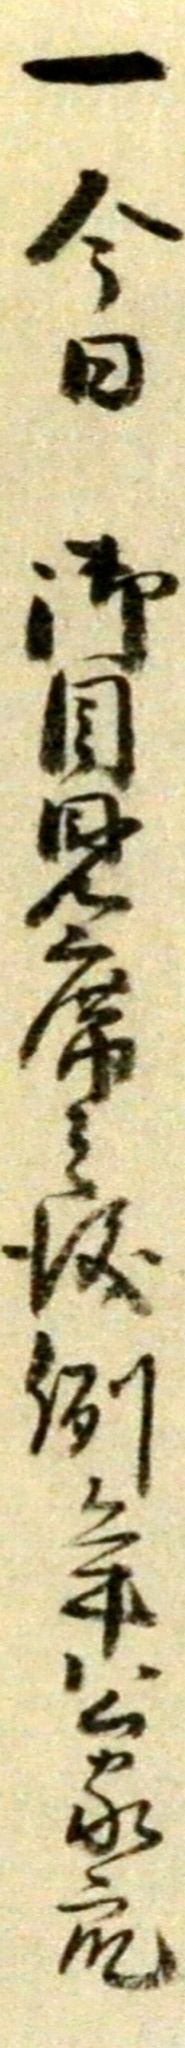一今日御目見席之儀例年公家衆
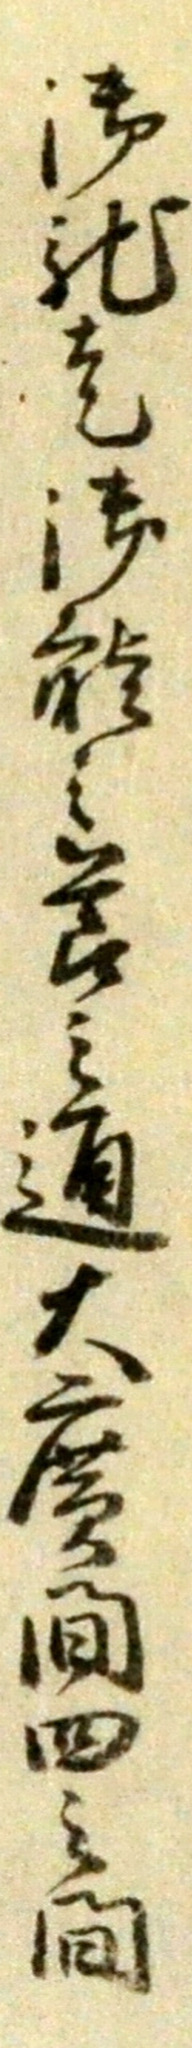御馳走御能之節之通大廣間四之間
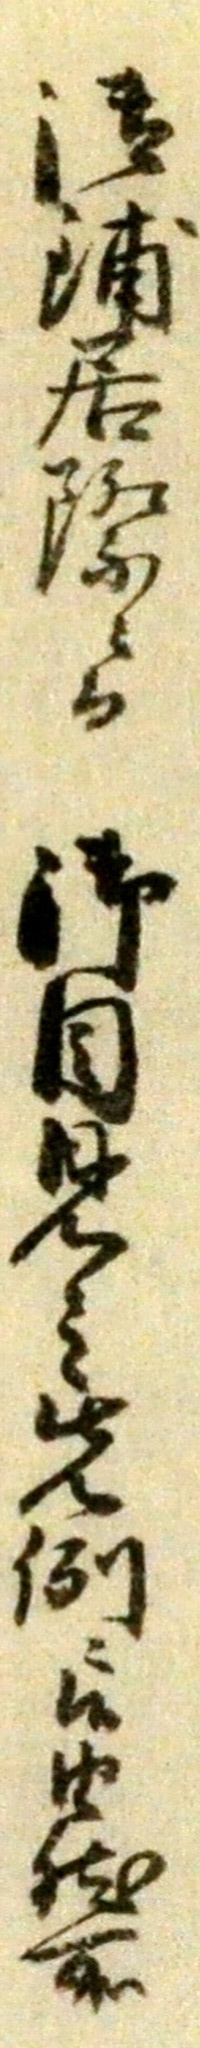御鋪居際ニ而御目見之先例ニ候由然所
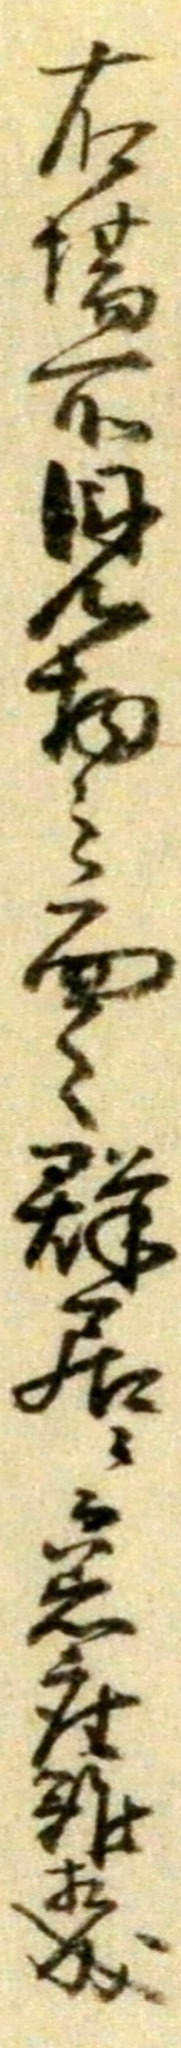右場所見物之面々群居ニ而着座難相成
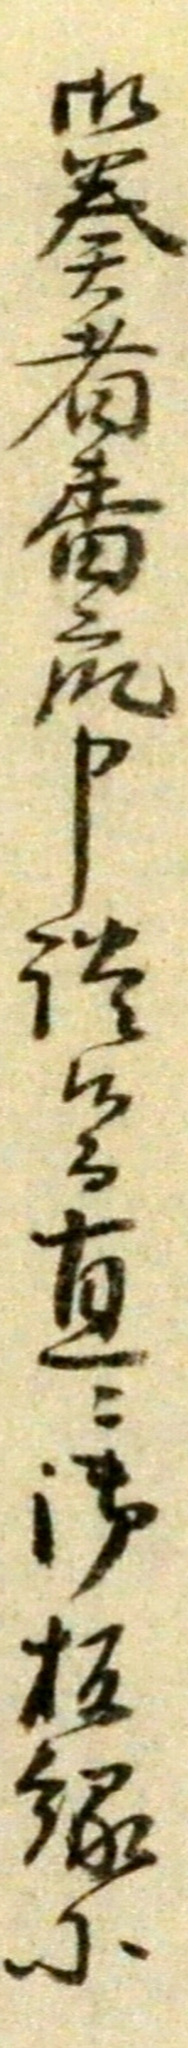御奏者番衆申談候而直ニ御板縁に
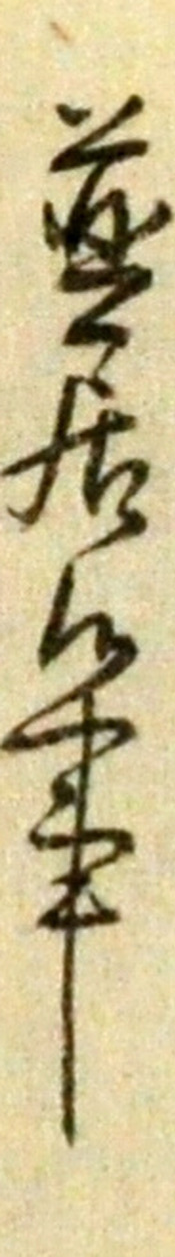並居候事
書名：若君様（家斉嫡男）誕生諸祝儀ノ節ノ留書外
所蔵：伊那市立高遠町図書館・合同会社AMANE
